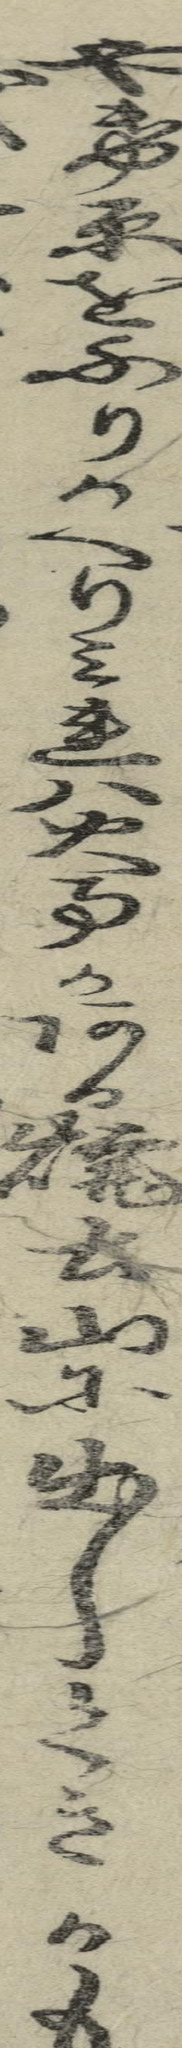やけ原をふりかへりみれは火事かある焼土山に出してきかも
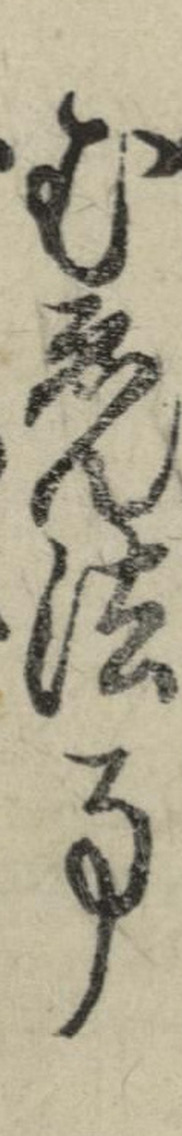むゑん法事
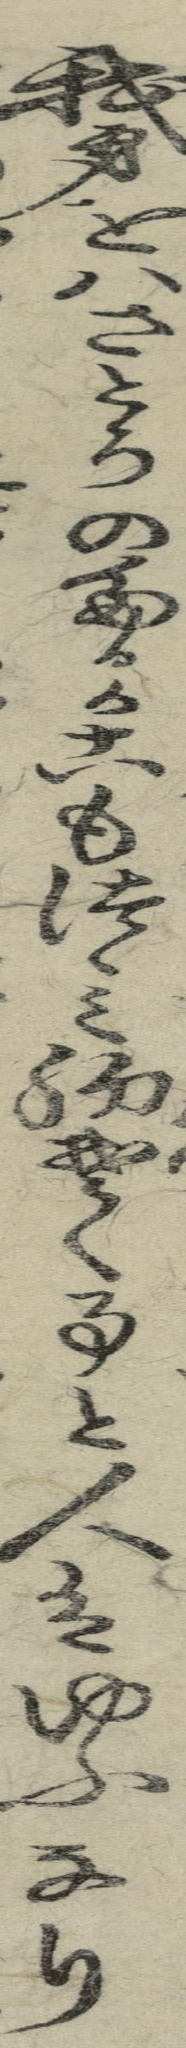我身をはさとうのたるかこもつゝみ約そく事と人はゆふなり
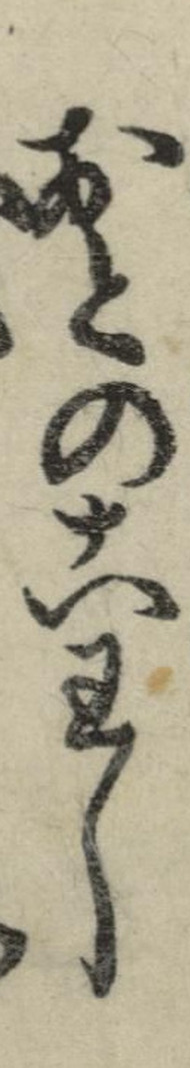おとのこわし
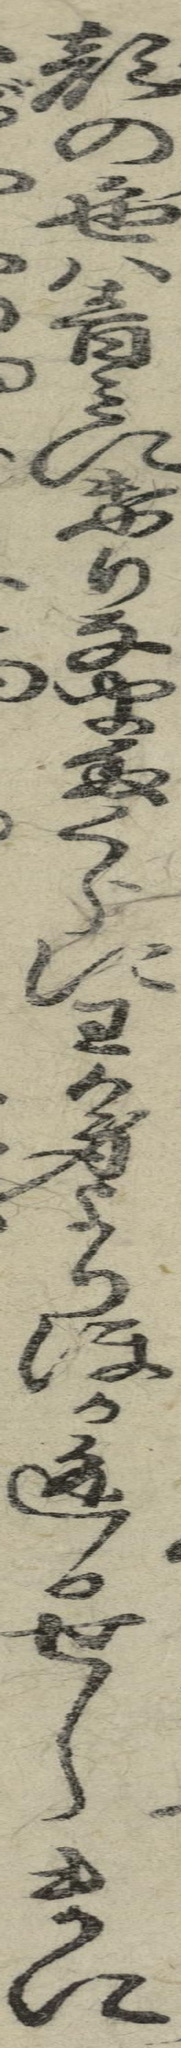顔の色は青みにけりなまたくらにわか身よりほか逃るせしまに
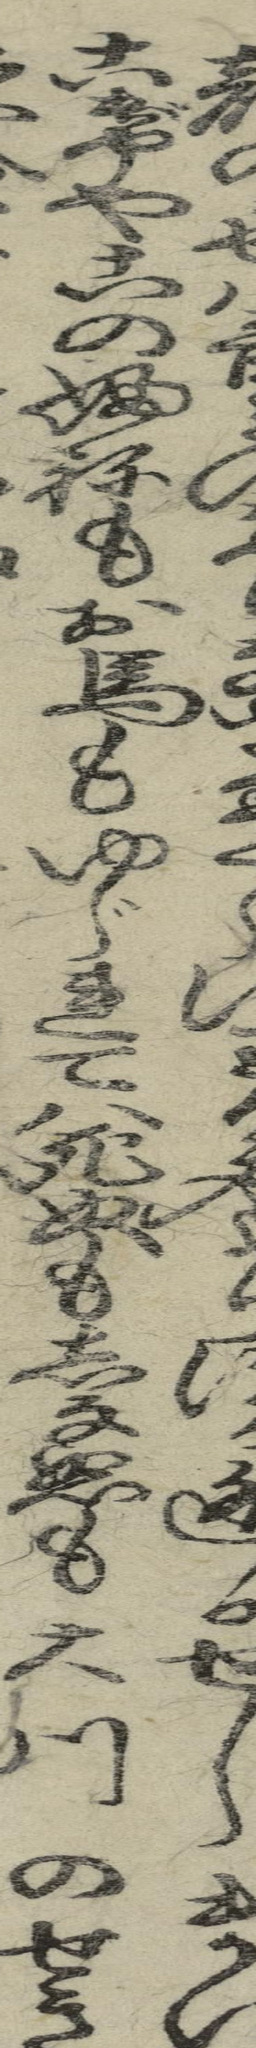こげやこのふねもお馬もゆられては死ぬもしなぬも大川のせき
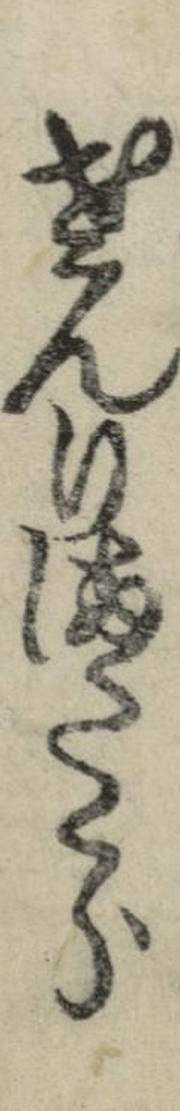けんりまたくら
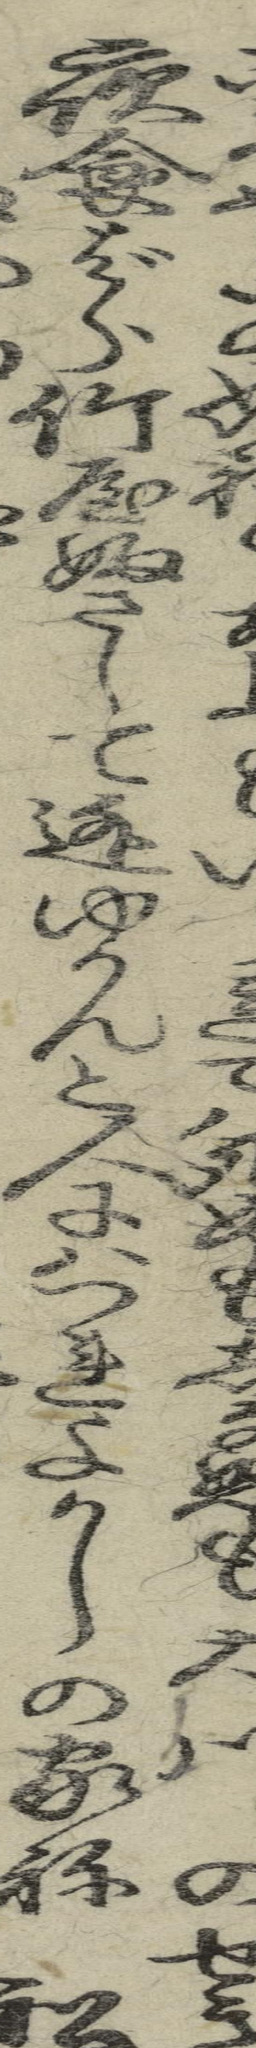夜食ばら竹やぶさして逃ゆかんと人にはつれよかしの家ね船
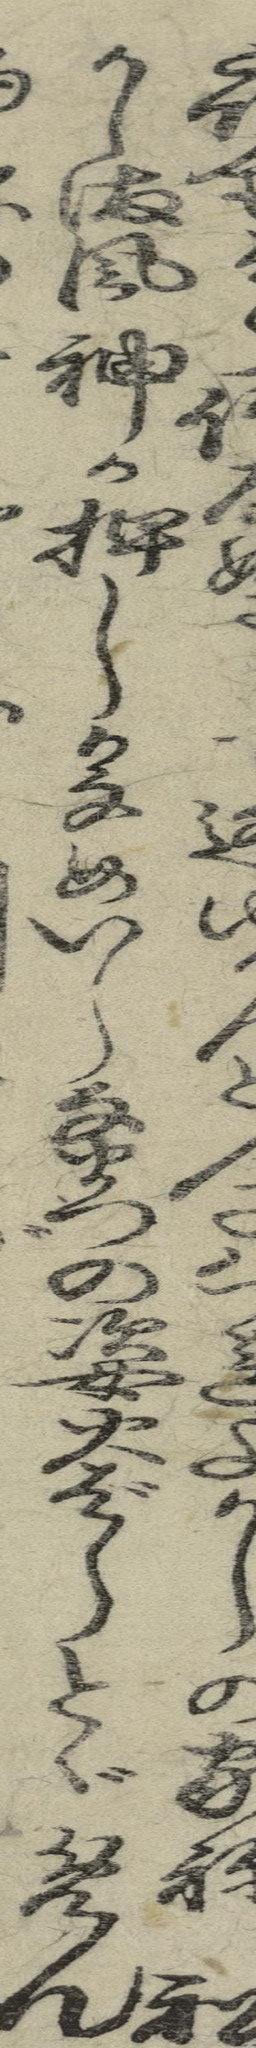かしま風神か押しかなめいしなまつの姿火ばしとゞめん
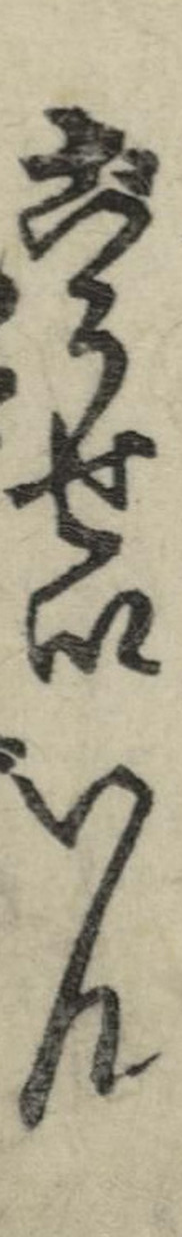ごうせいいん
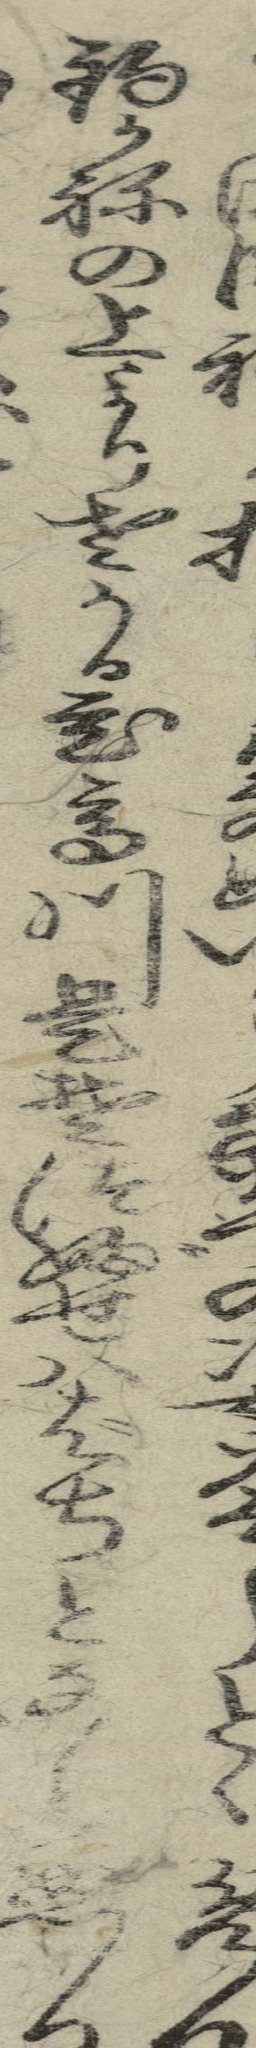釣かねの上よりさかるひ高川是そつぶせはｂちとなしぬる
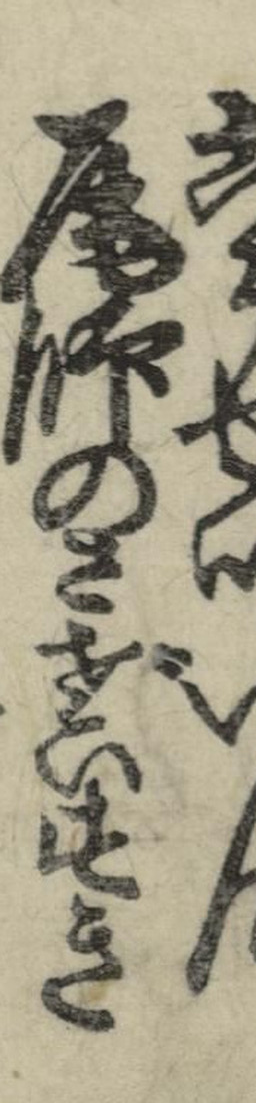尾師のさざいすき
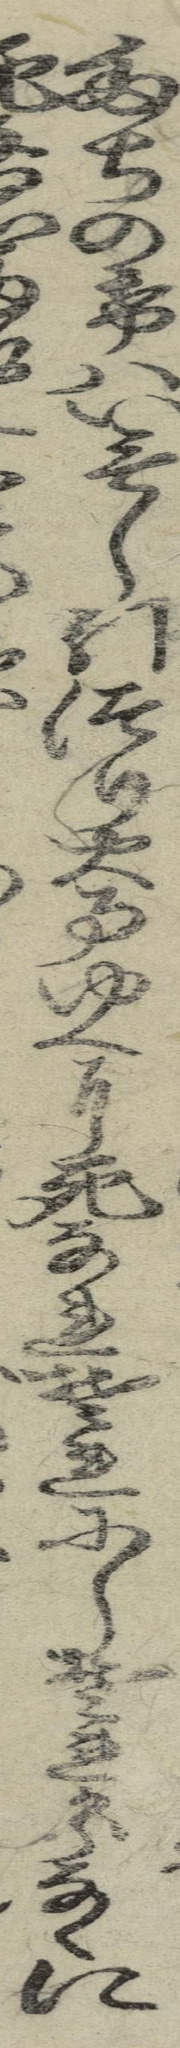たちのけはいもし引つり火事ゆへに死なれそれにしそれからなくに
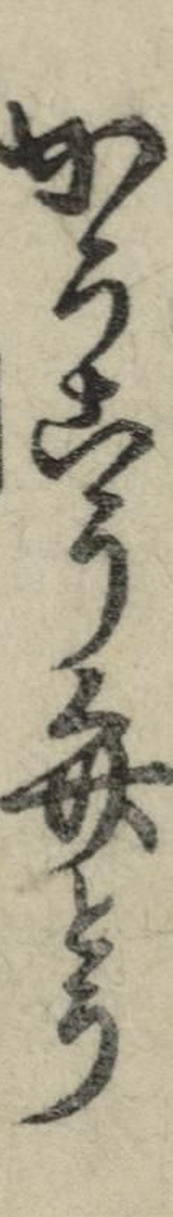かうこう弁とう
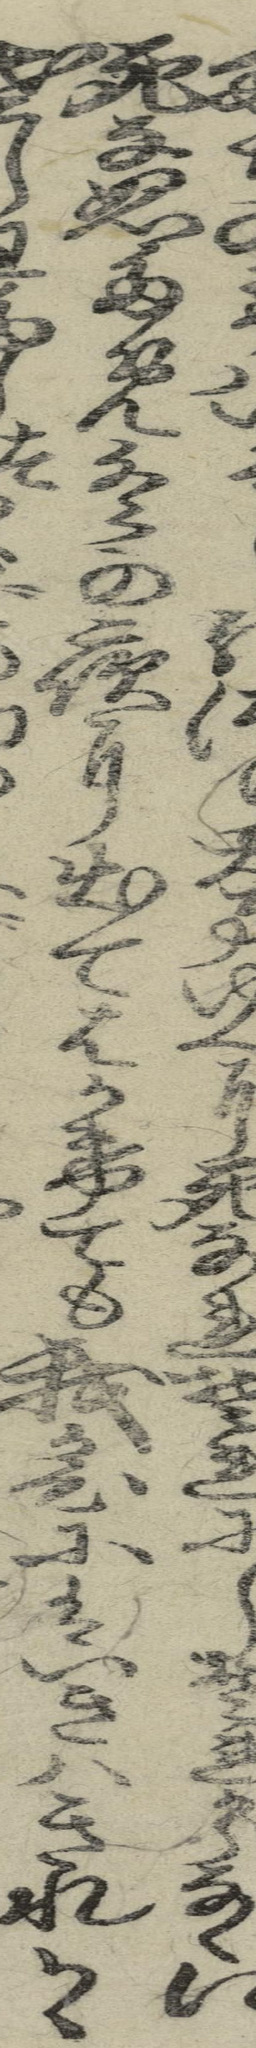死なぬため冬の夜に出てはかけても我か心にはいきはきれかく
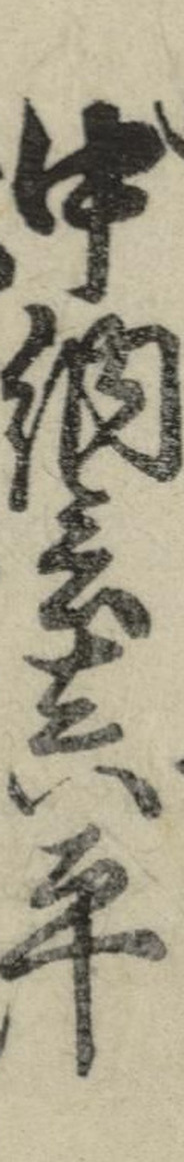中納言真平
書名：泰平の美世鹿島百人一首
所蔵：東京大学地震研究所図書室 Earthquake Research Institute Library, The University of Tokyo, JAPAN
